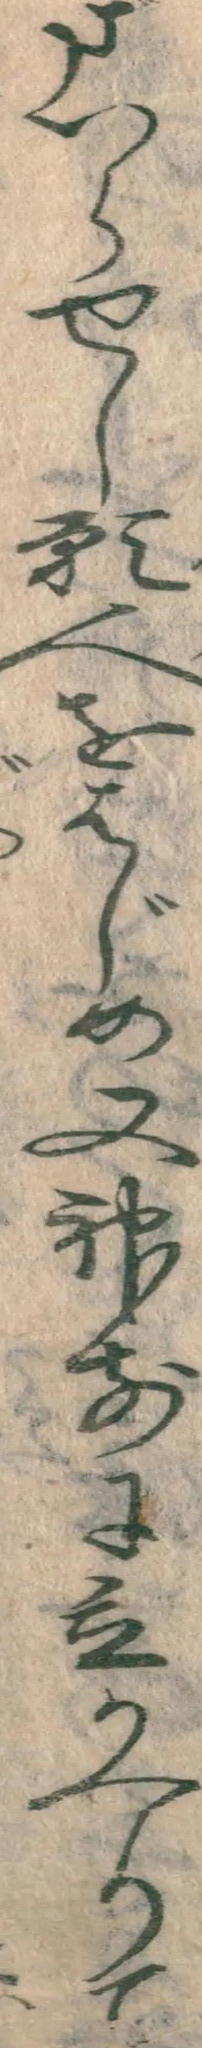まいらせし願人をはじめ又神前に立かへりて
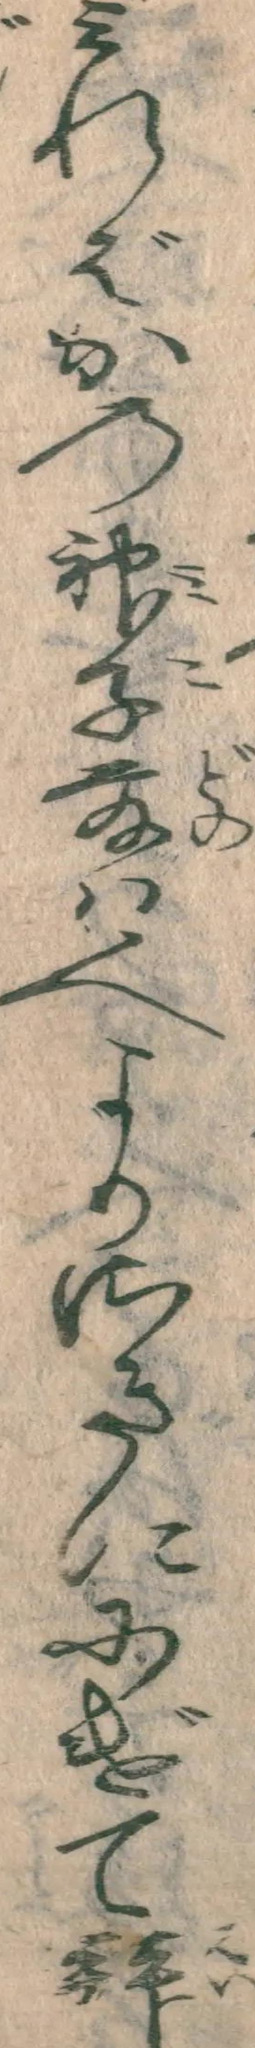みればかの神子殿は人よりさきににげて拝
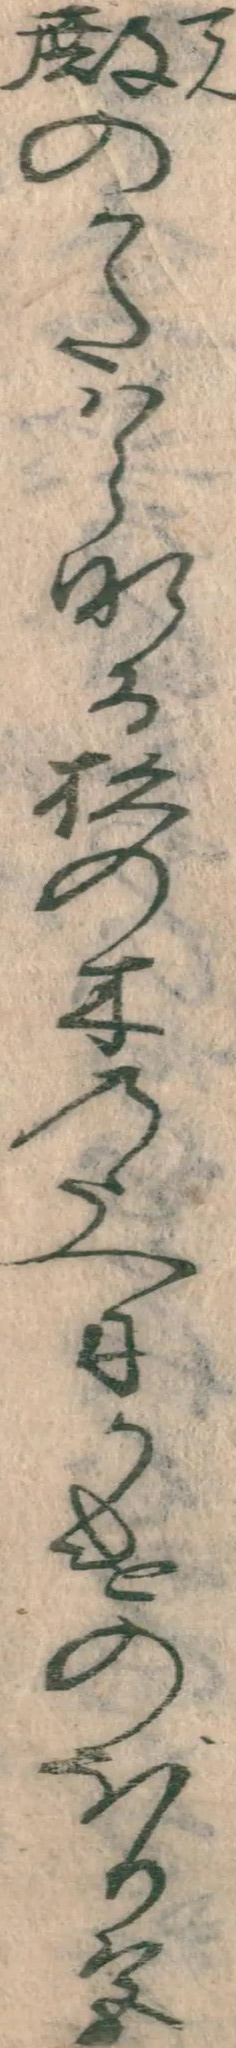殿のかたはらなる松の木のうへにかけのほり色
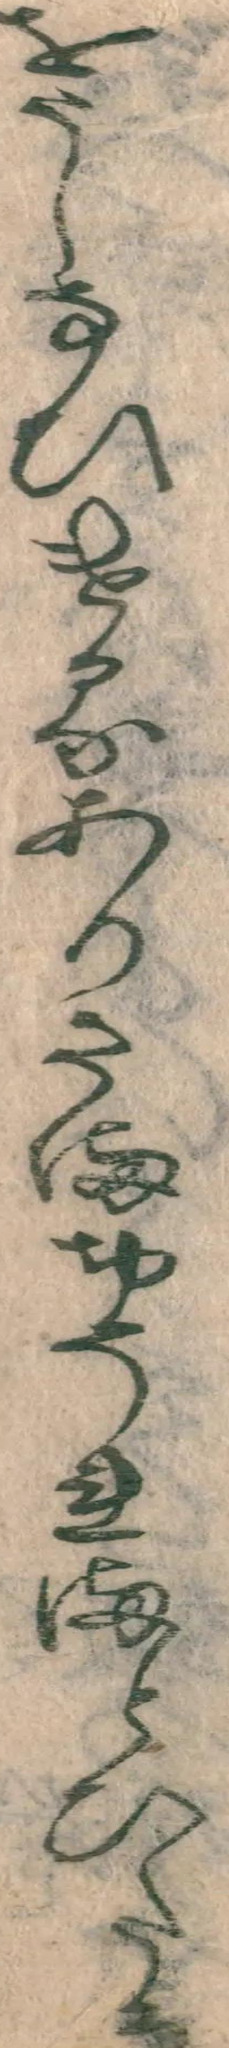をうしなひけるありさまおそれまとひたる
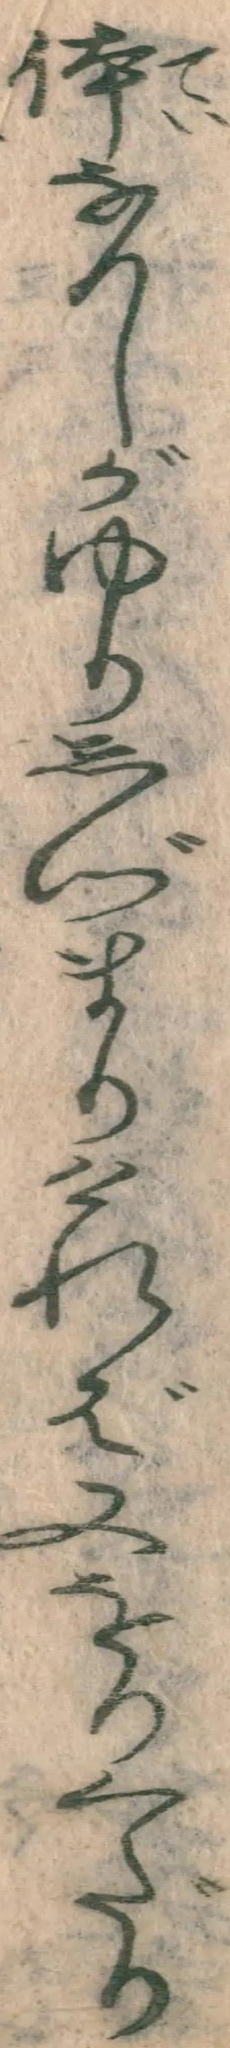体なりしがゆりしづまりければ又をりくだり
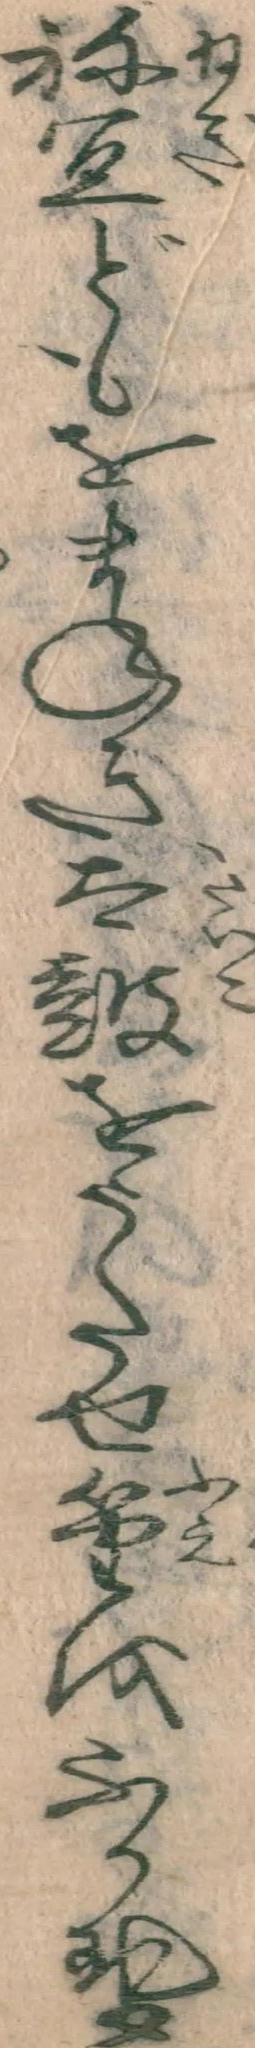祢宜どもをまねき太鼓をうたせ笛をふかせ
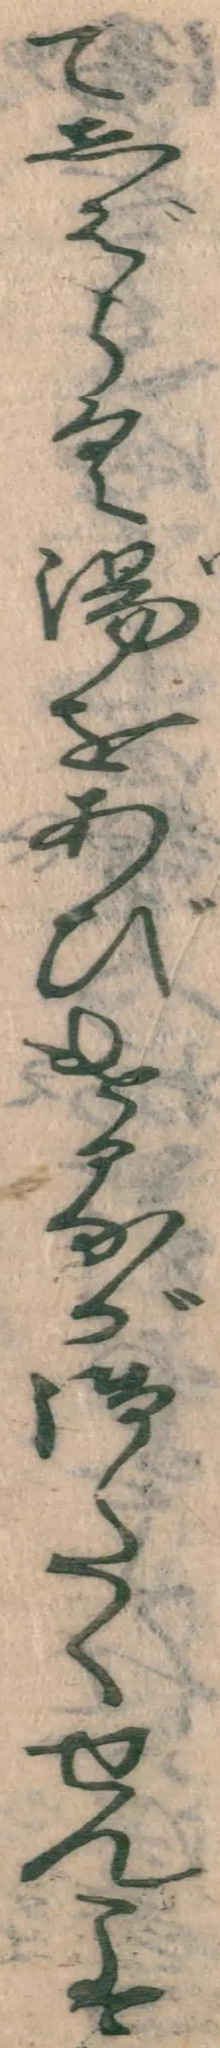てしばらく湯をあびけるが御たくせんこそ
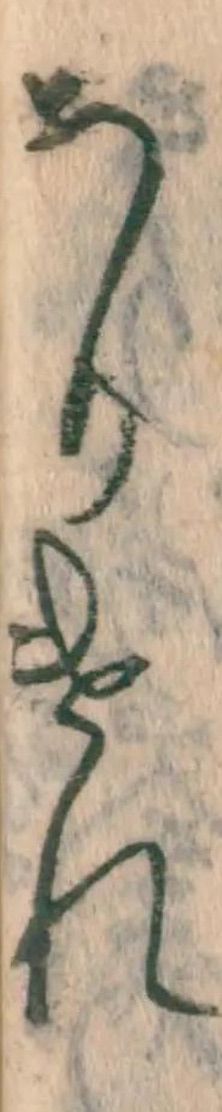ありけれ
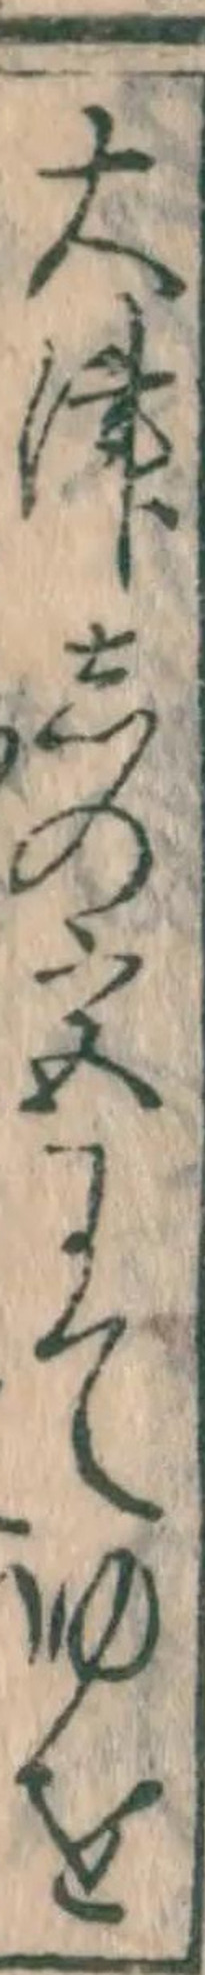大津しの宮にてゆを

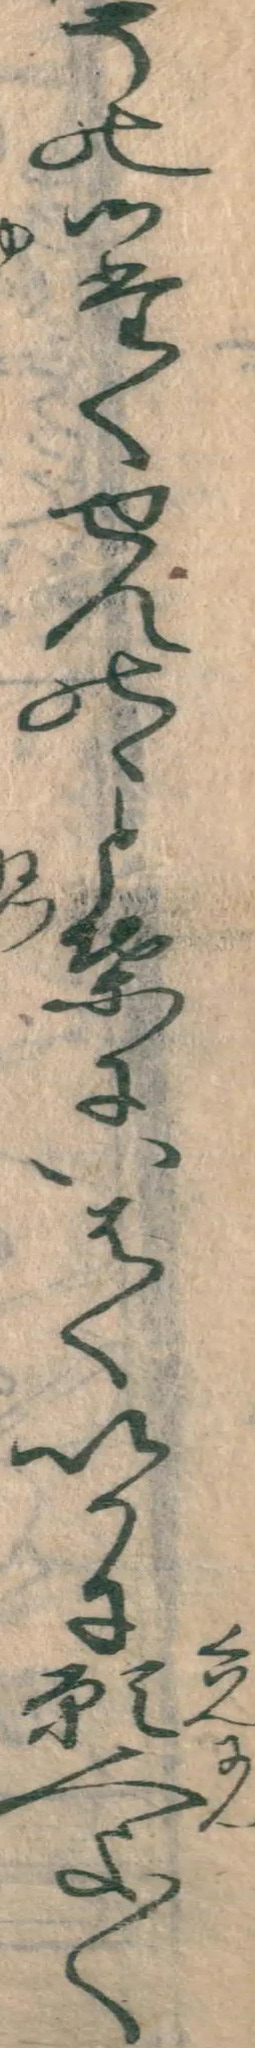その御たくせんのこと柴にいはくいかに願人よく
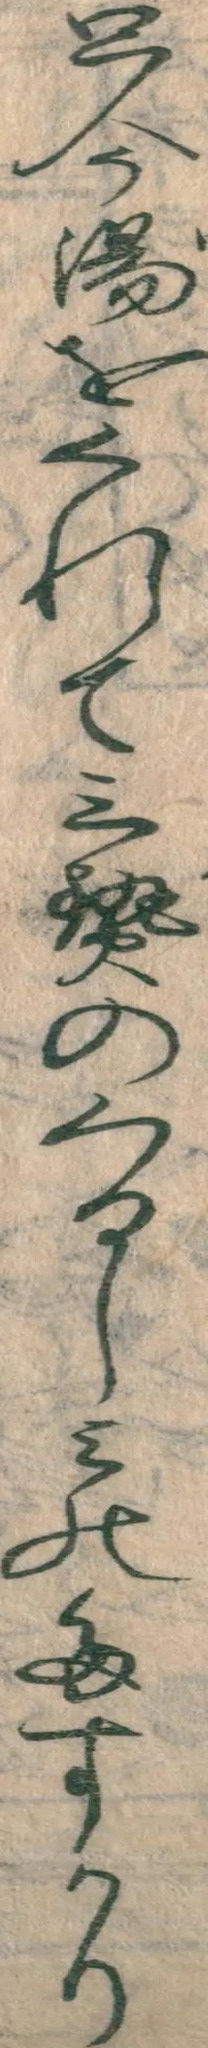只今湯をくれて三熱のくるしみのたすかり
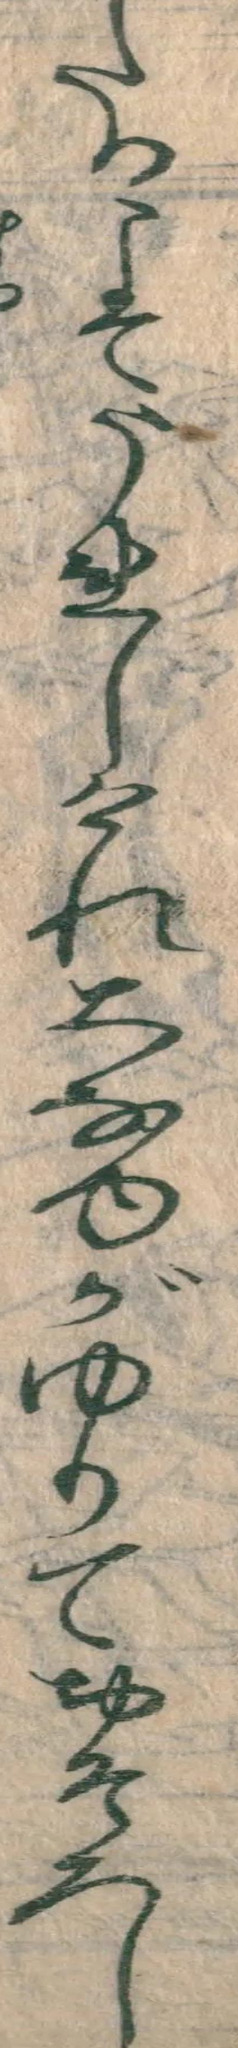たるこそうれしけれ大なゆがゆりておそろし
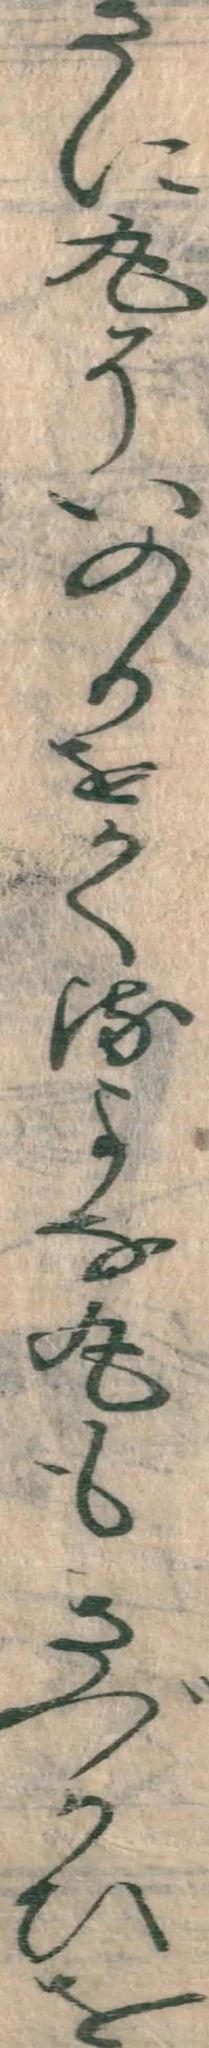さに丸にいのりをかくるよな丸もきづかひを
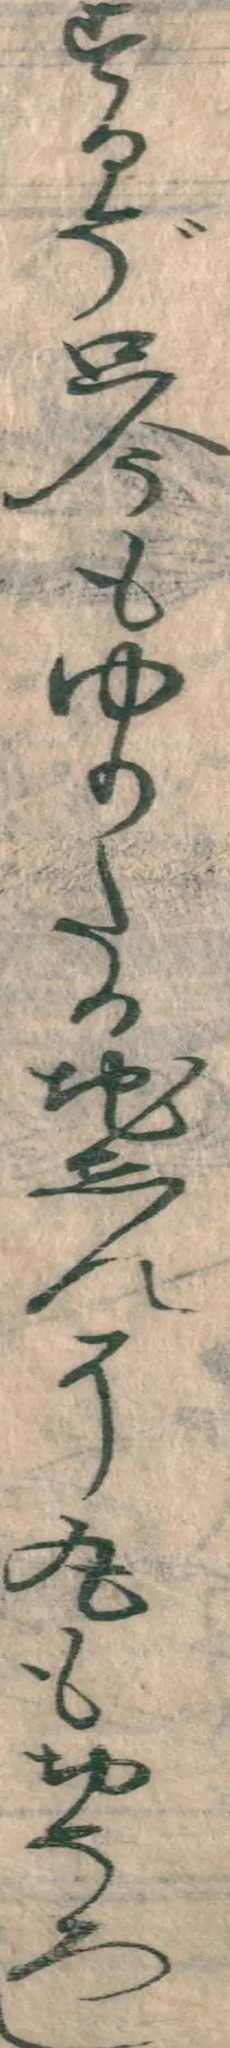するぞ只今もゆりたる地しんに丸もおそろし
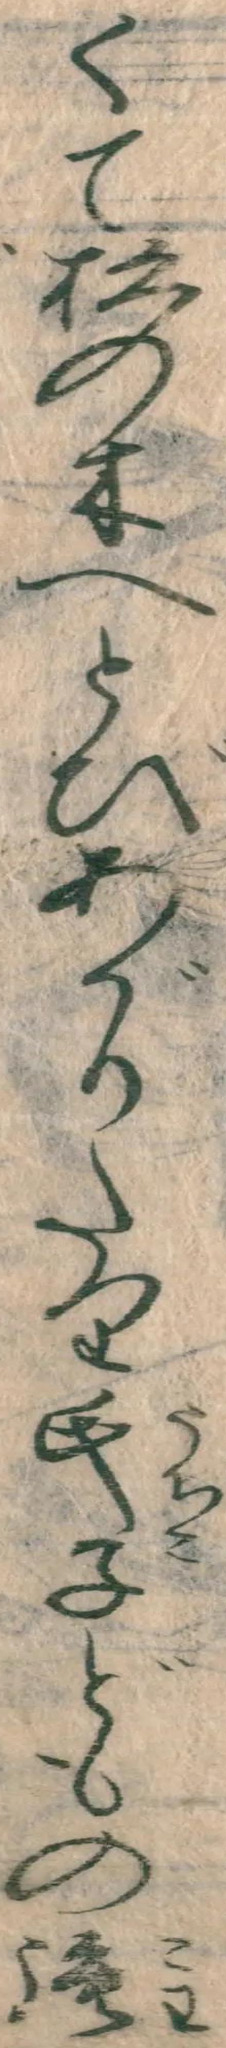くて松の木へとびあがりたり氏子どもの強
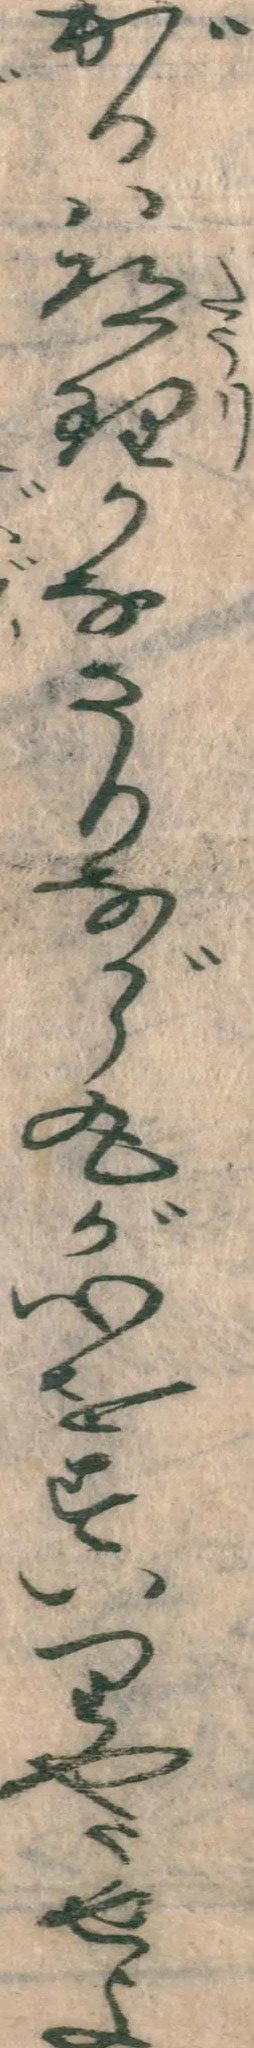がるは道理かなさりながら丸が心をすいりやうせよ
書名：艱難目異志. 上,下
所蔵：国立国会図書館 National Diet Library, JAPAN
